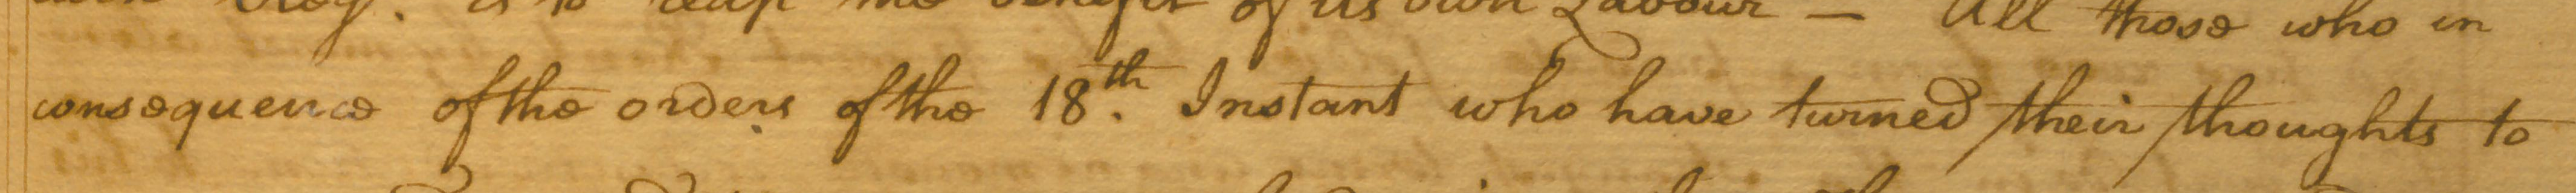consequence of the orders of the 18^th. Instant who have turned their thoughts to
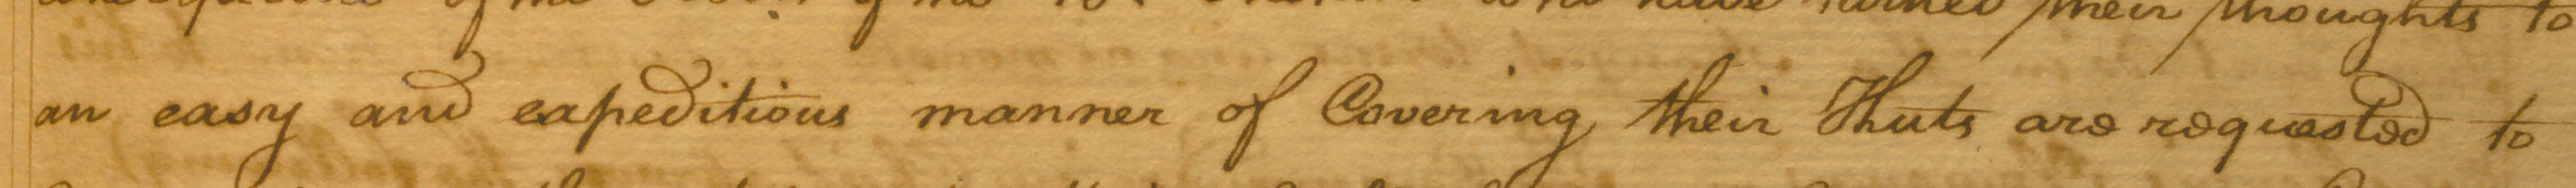an easy and expeditious manner of Covering their Huts are requested to
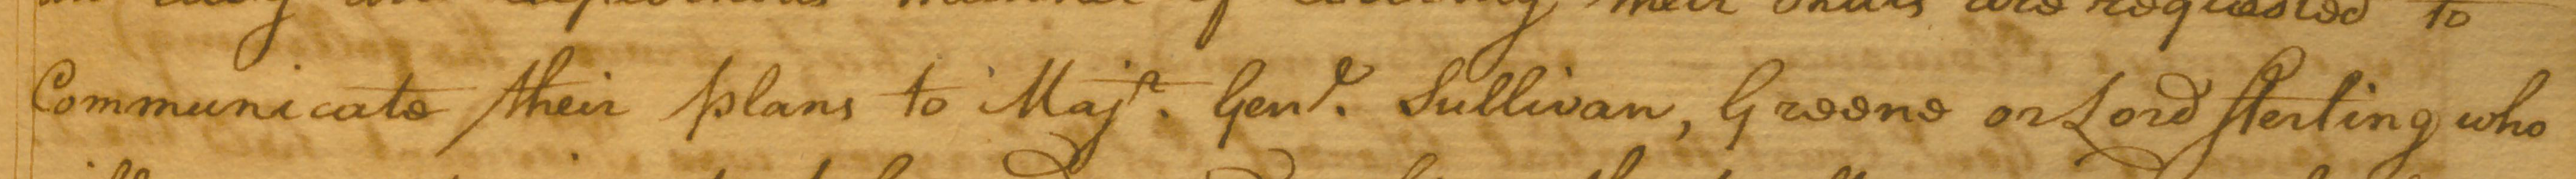Communicate their plans to Maj^r. Gen^l. Sullivan, Greene or Lord Sterling who
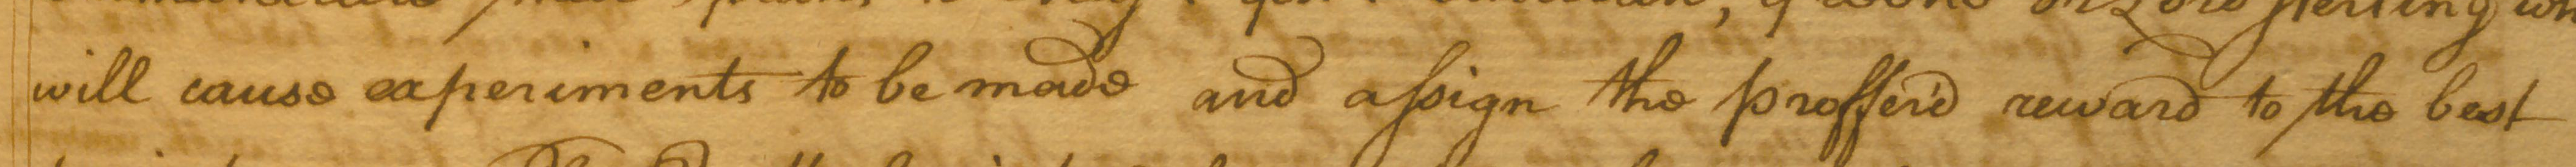will cause experiments to be made and assign the proffer'd reward to the best
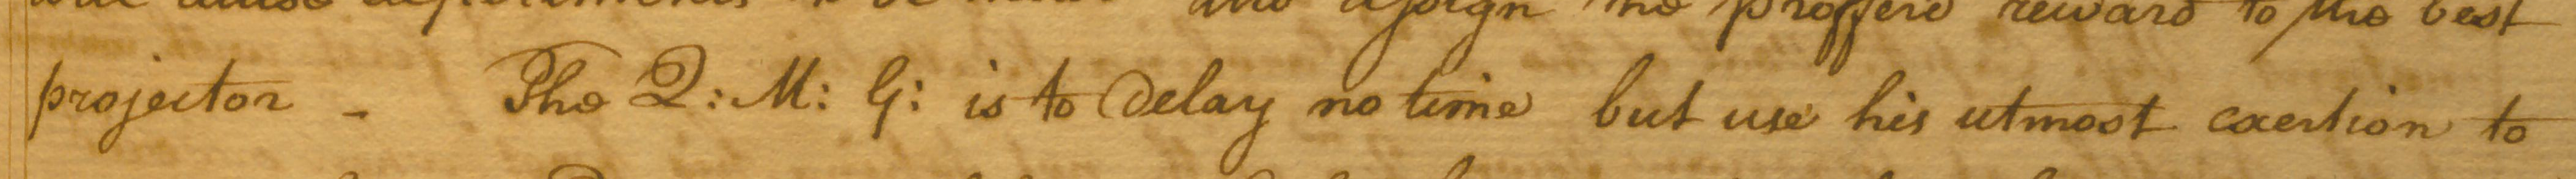projection- The Q: M: G: is to delay no time but use his utmost exertion to
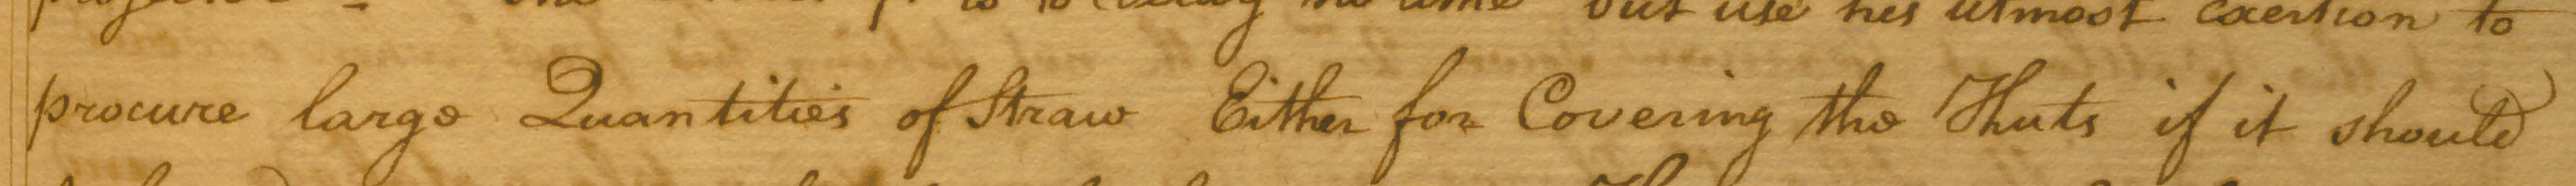procure large Quantities of Straw Either for Covering the Huts if it should
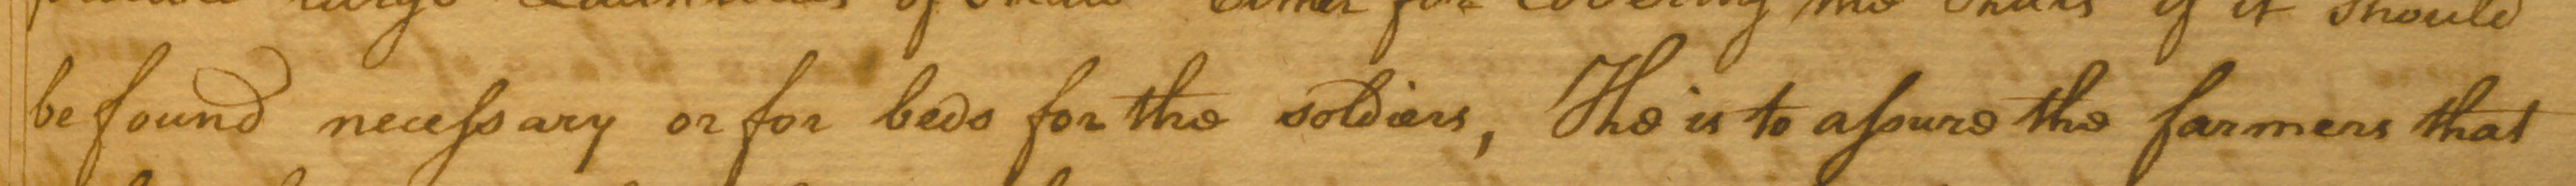be found necessary or for beds for the soldiers, He is to assure the farmers that
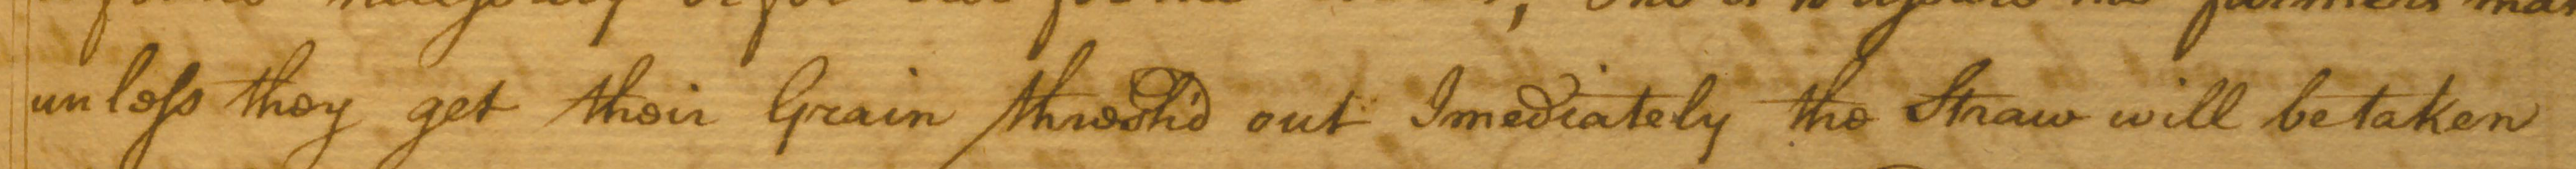unless they get their Grain thresh'd out Immediately the Straw will be taken
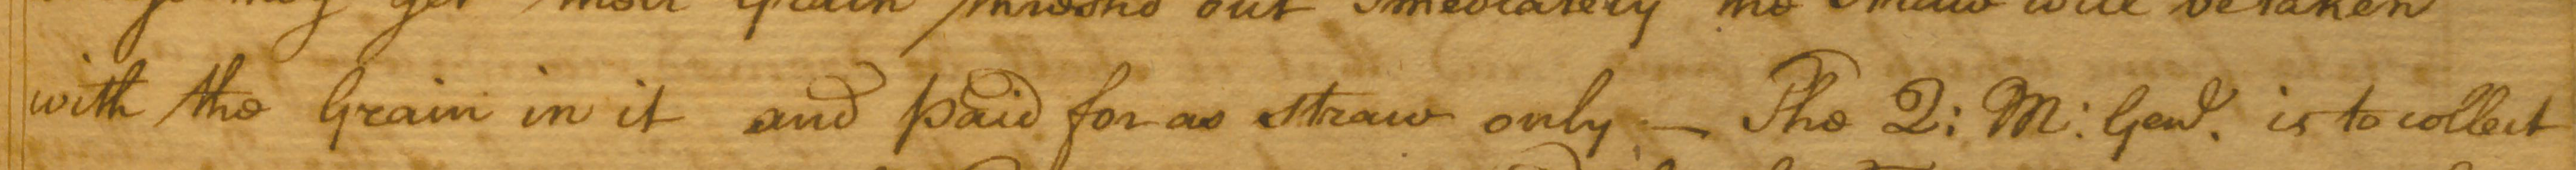with the Grain in it and paid for as straw only- The Q: M: Gen^l. is to collect
